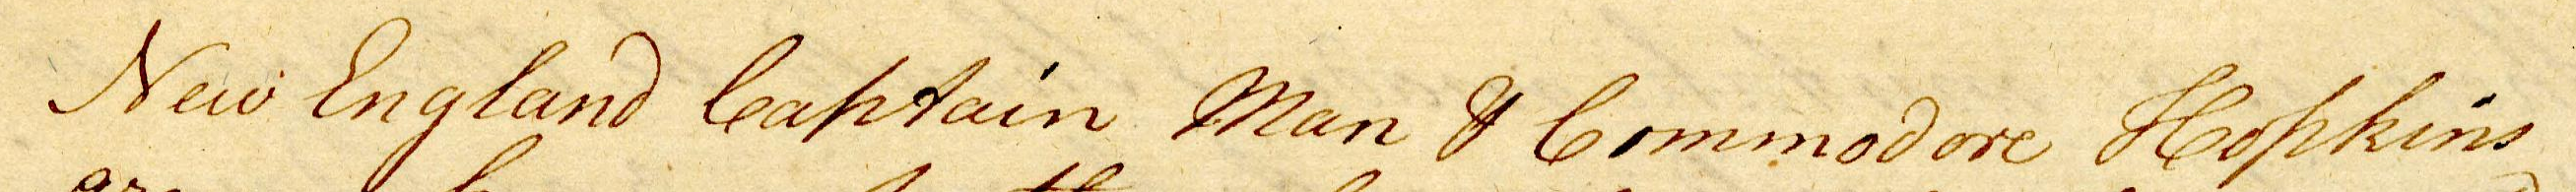New England Captain Man & Commodore Hopkins
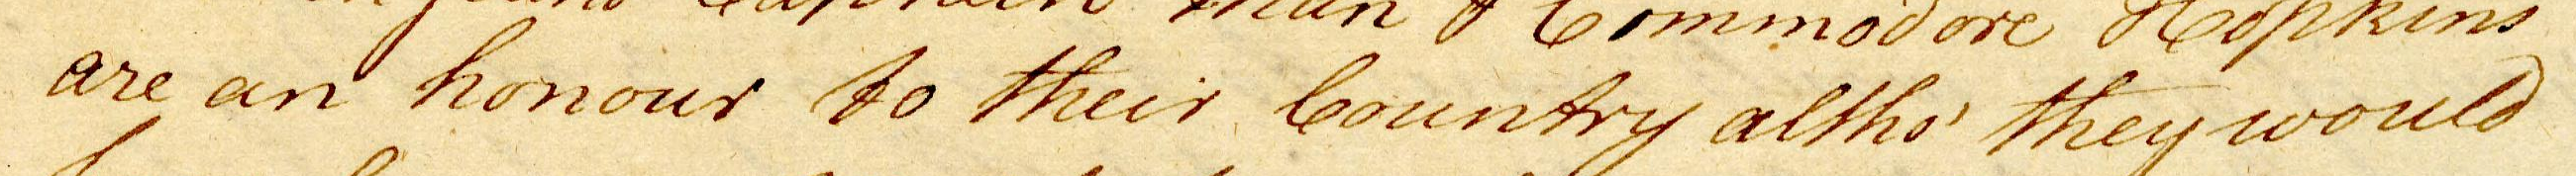are an honour to their Country altho' they would
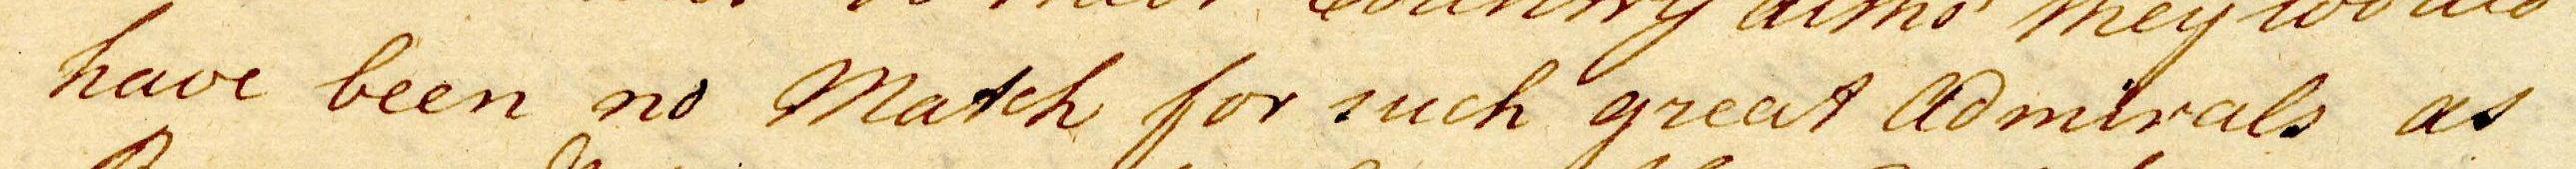have been no Match for such great Admirals as
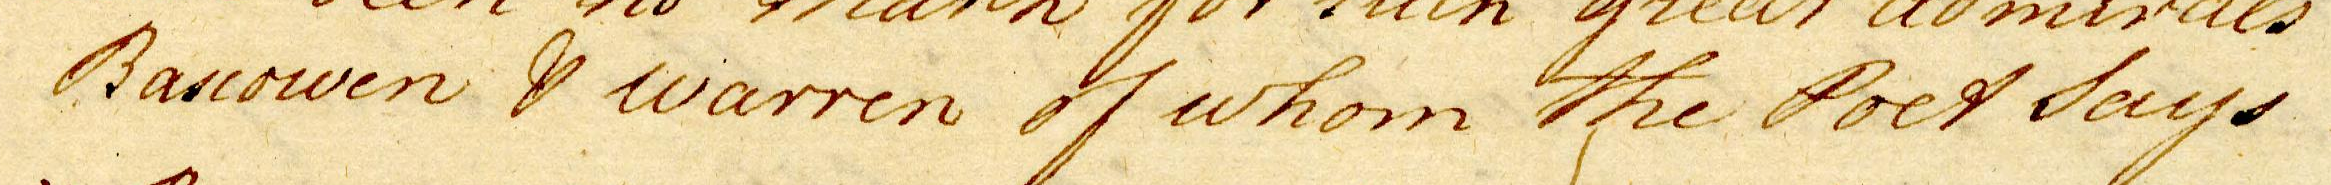Bascowen & Warren of whom the Poet says
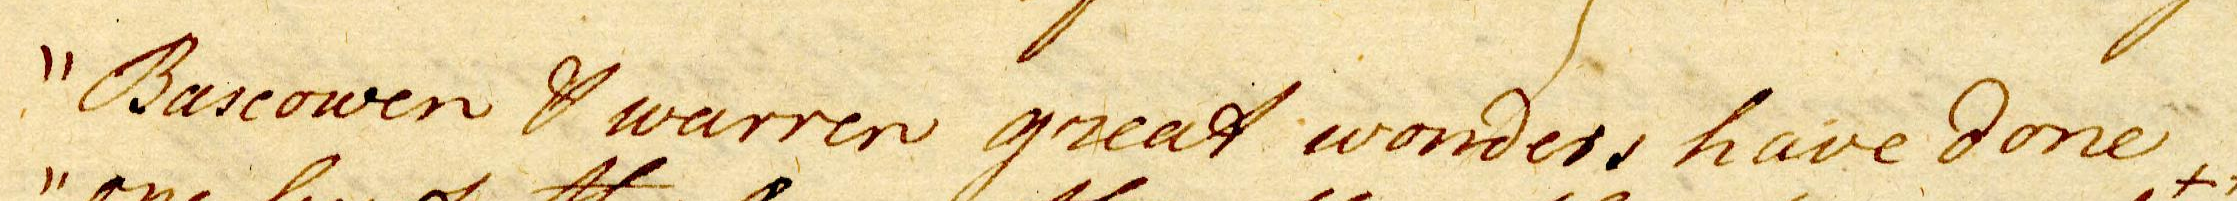"Bascowen & warren great wonders have done
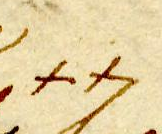++
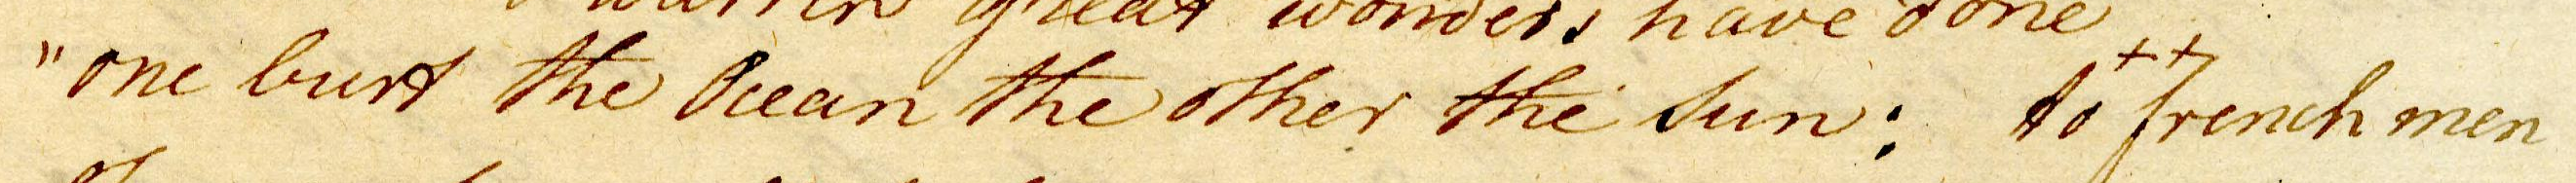"one but the Ocean the other the Sun: to french men
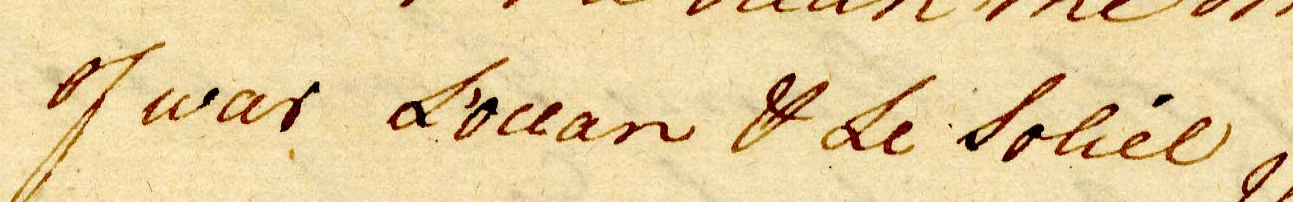of war L'oecan & Le Soliel
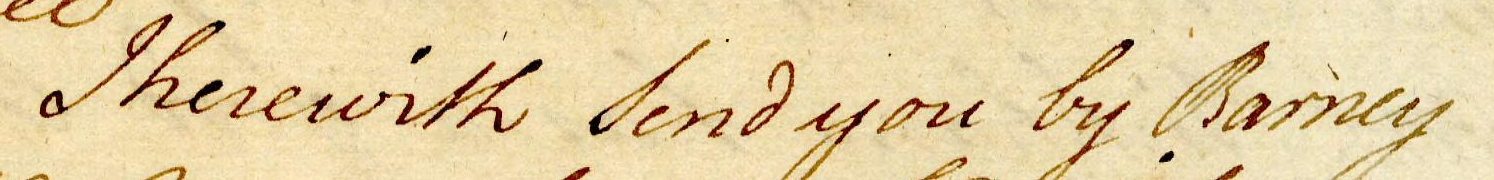I herewith send you by Barney
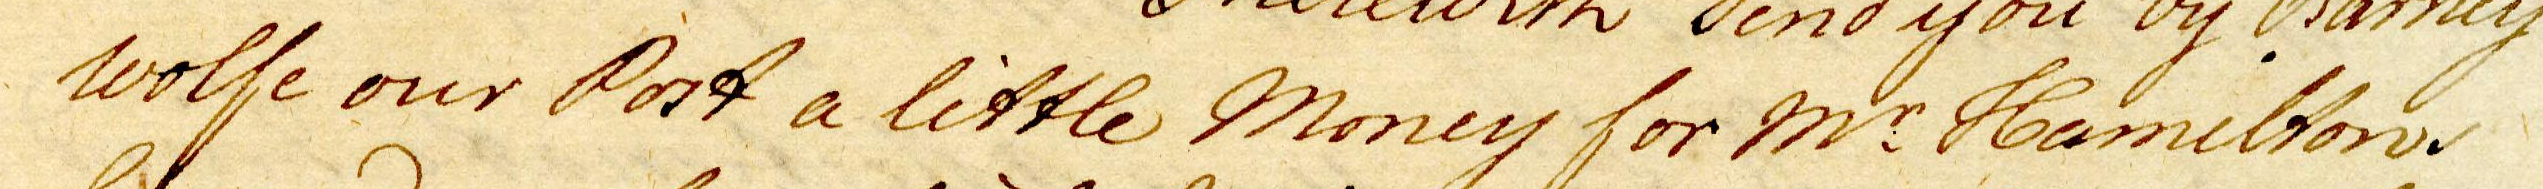Wolfe our Post a little Money for M^r. Hamiltons
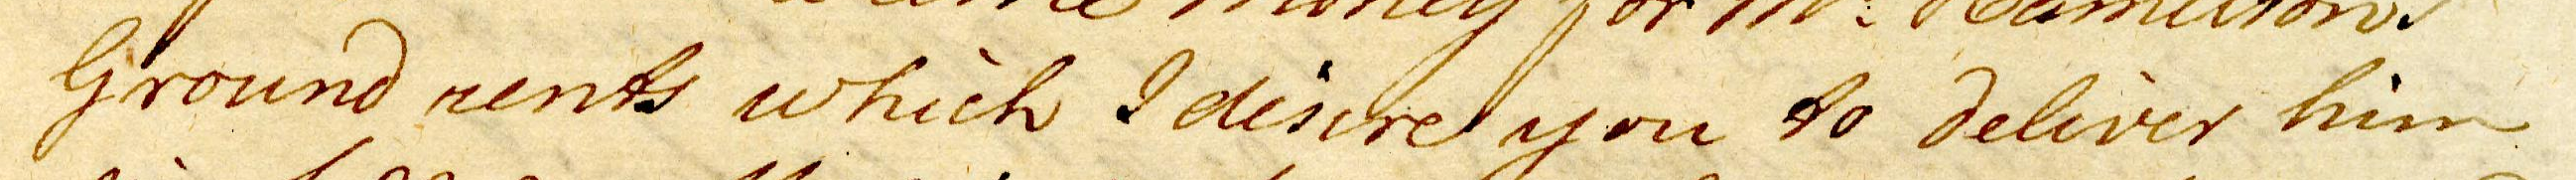Ground rents which I desire you to deliver him
